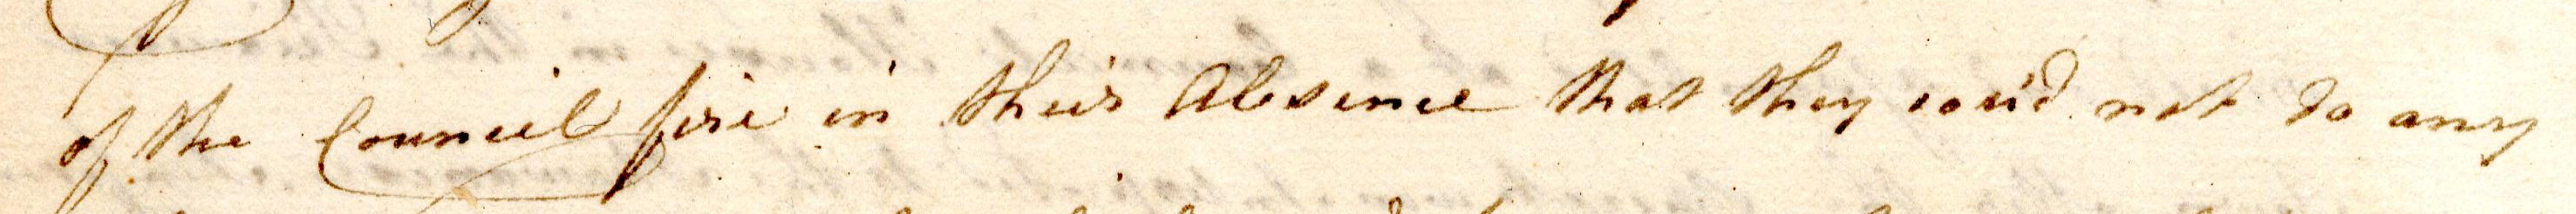of the Council fire in thier Absence that they cou'd not do any
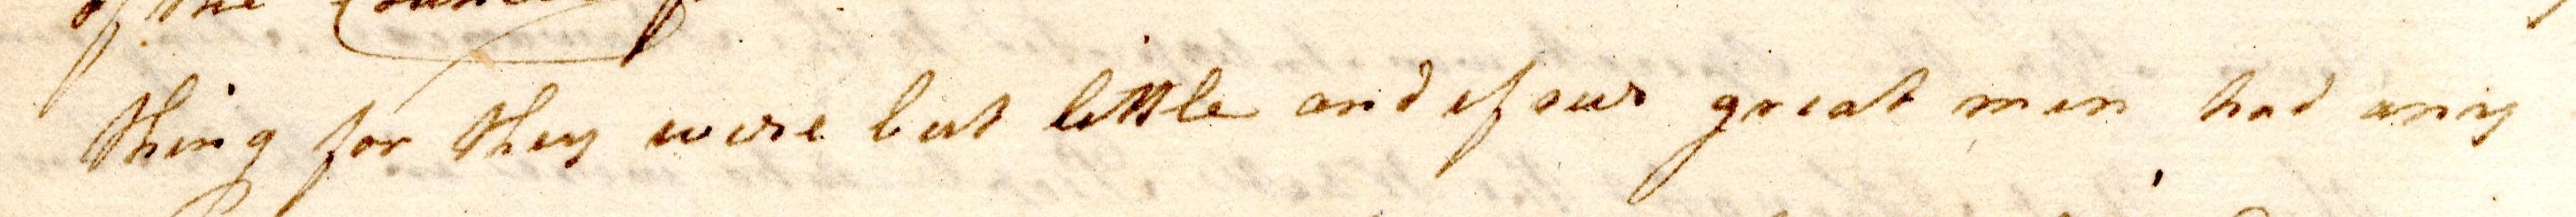thing for they were but little and if our great men had any
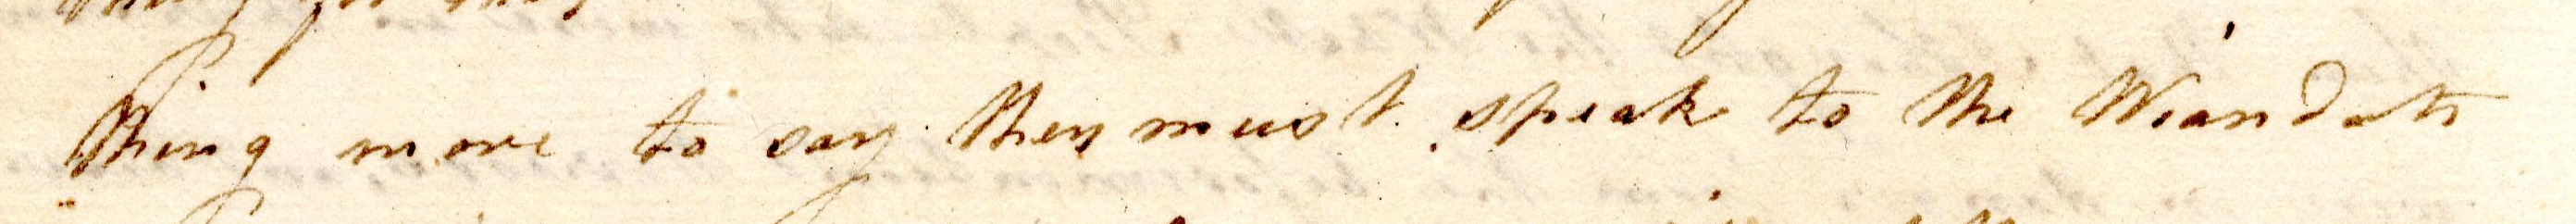thing more to say they must speak to the Wiandots
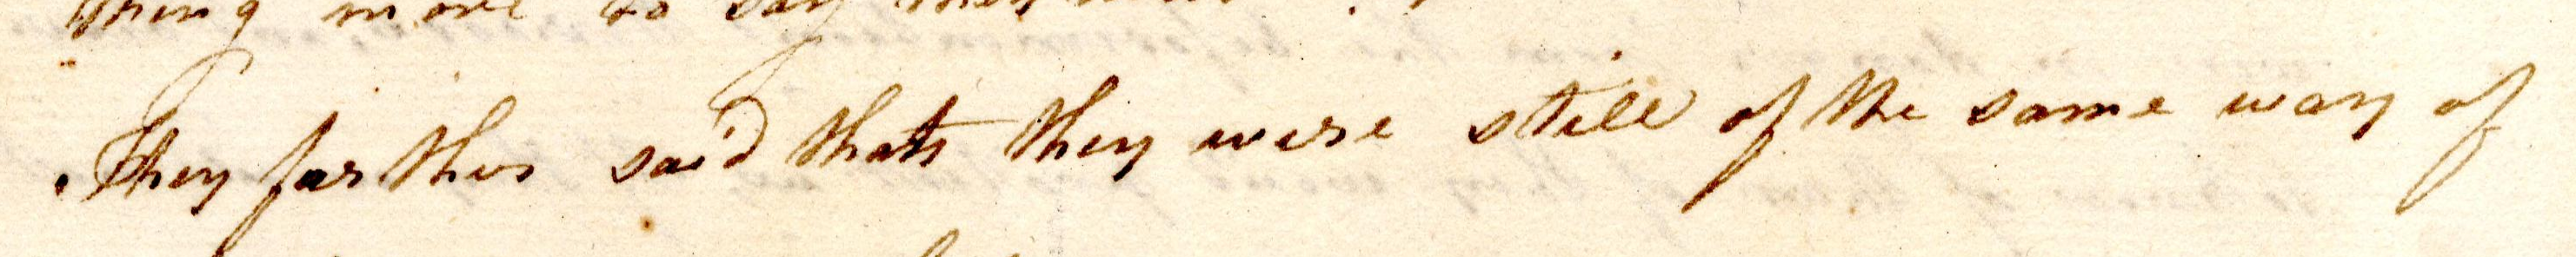They further said thats they were still of the same way of
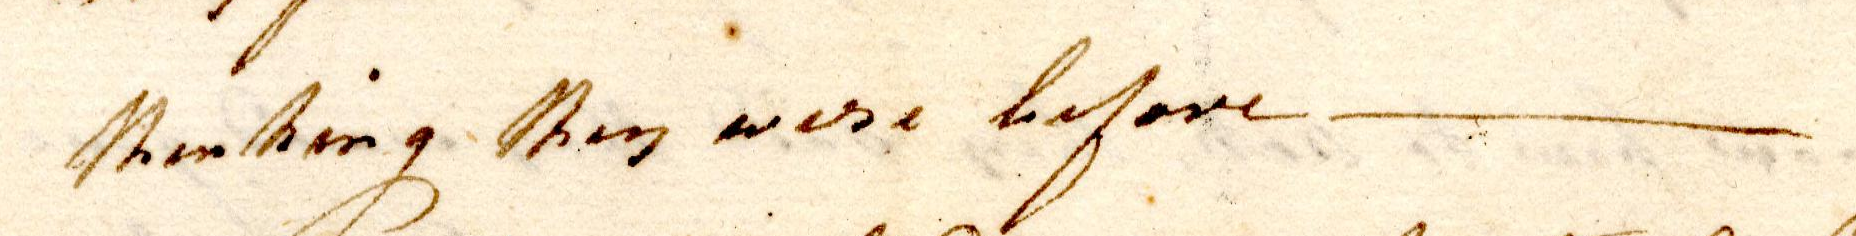thinking they were before-
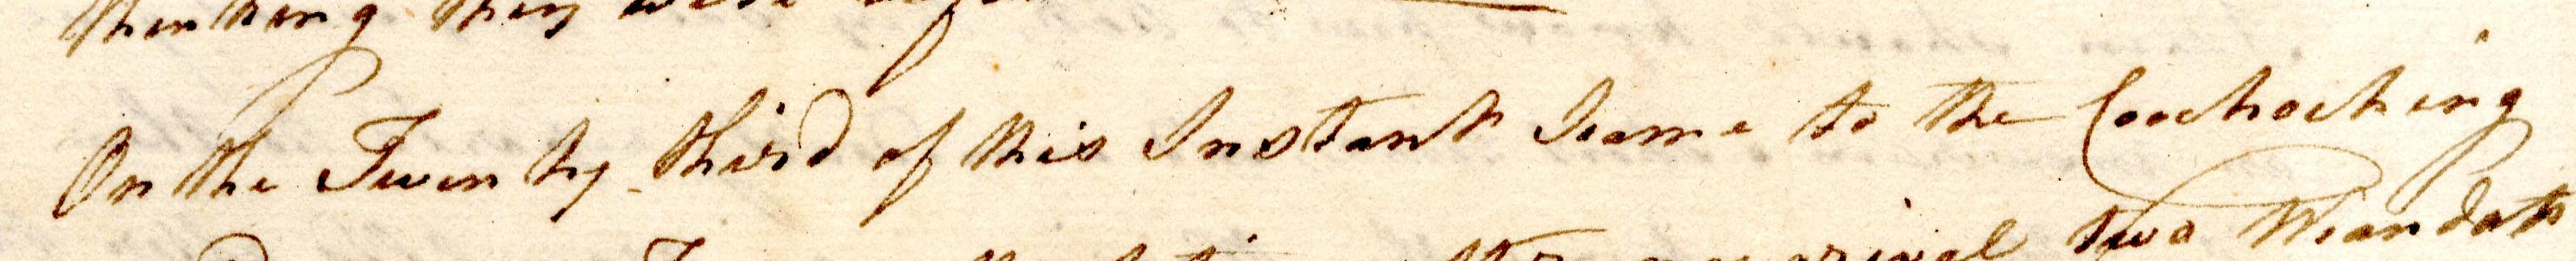On the Twenty third of this Instant I came to the Coochocking
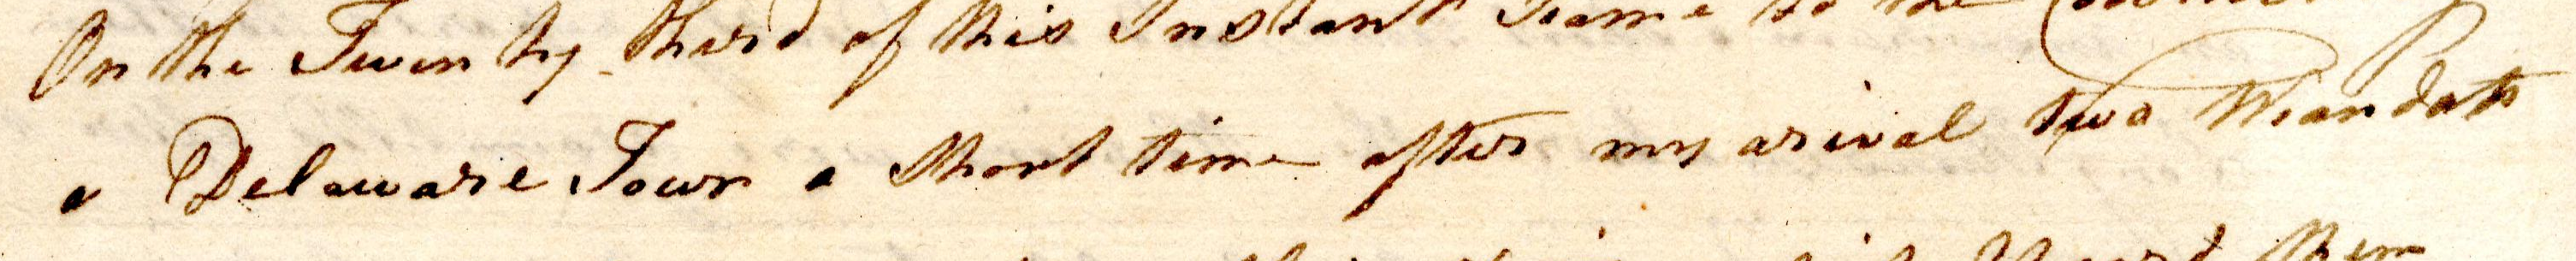a Delaware Town a Short time after my arrival two Wiandats
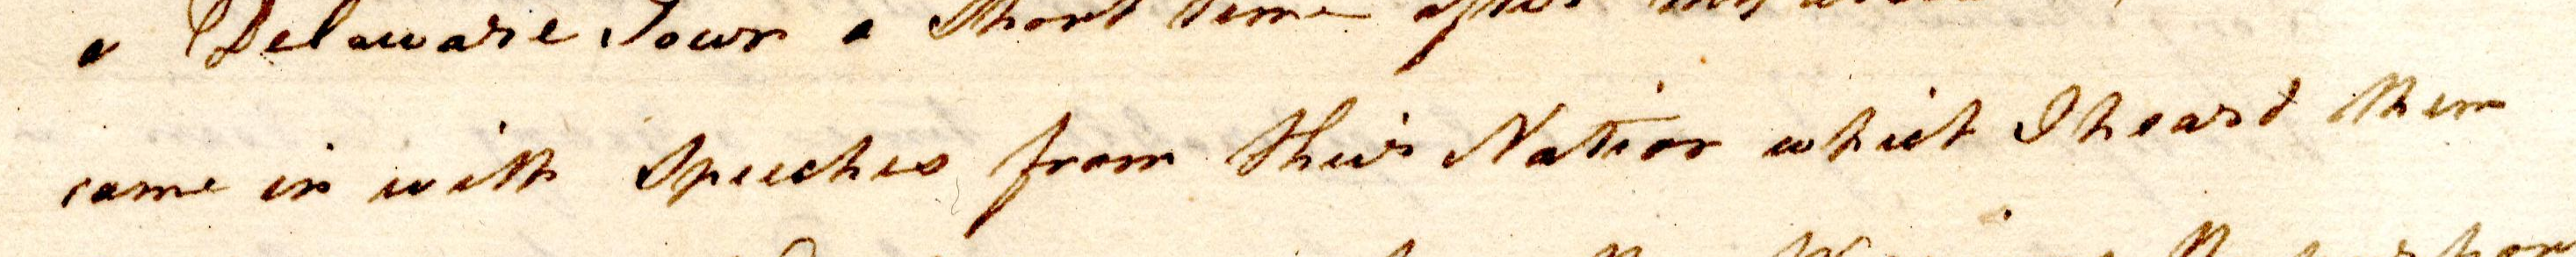came in with speeches from their Nation which I heard them
